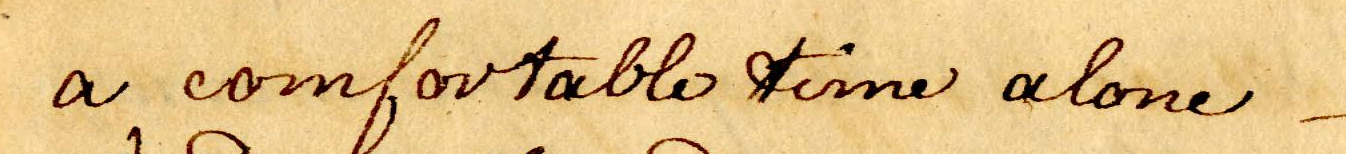a comfortable time alone -
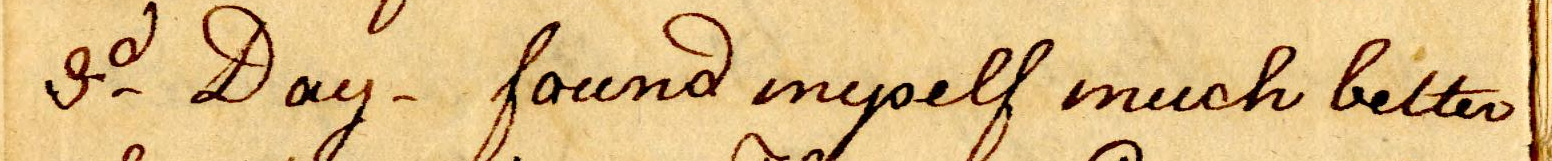3^d Day- found myself much better
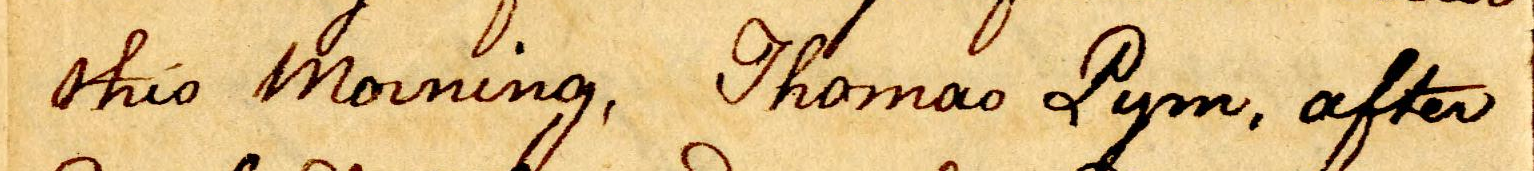this Morning, Thomas Pym, after
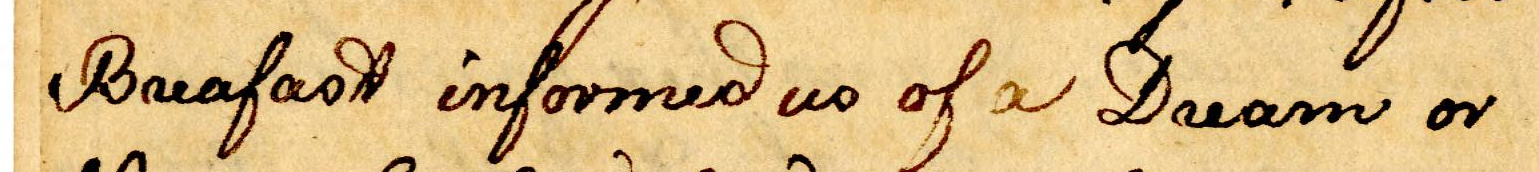Breafast informed us of a Dream or
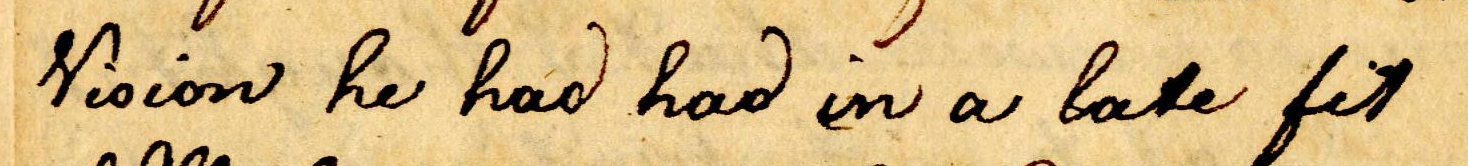Vision he had had in a late fit
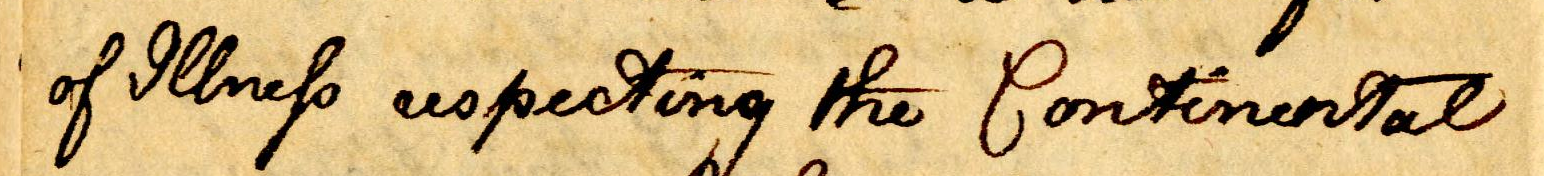of Illness respecting the Continental
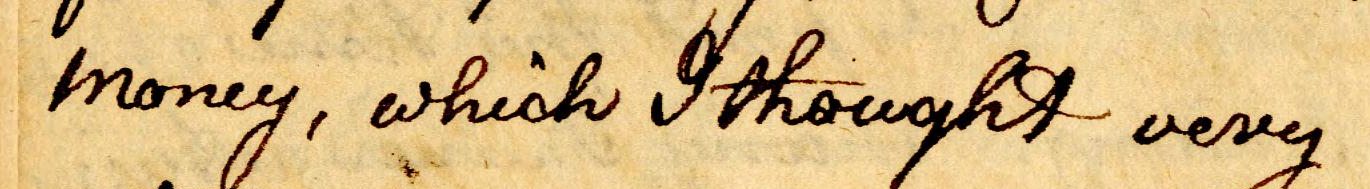Money, which I thought very
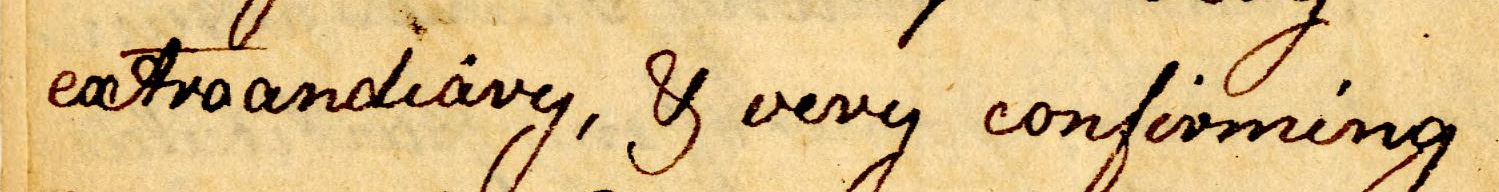extroandiary, & very confirming
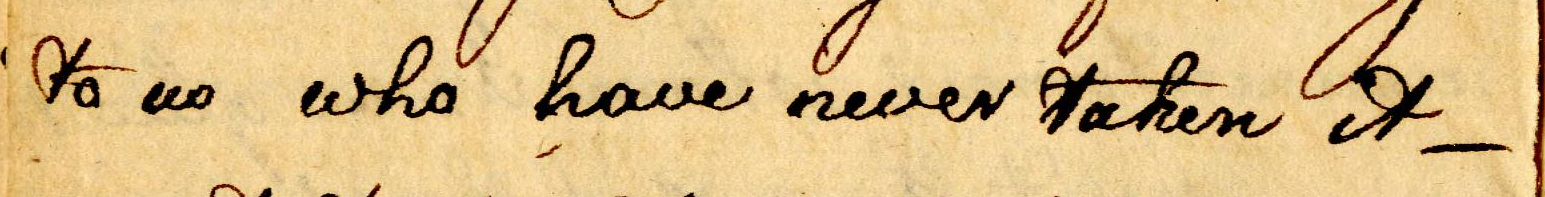to us who have never taken it-
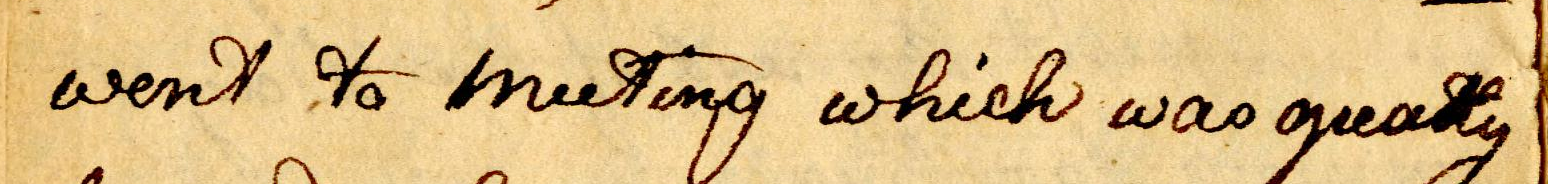went to Meeting which was greatly
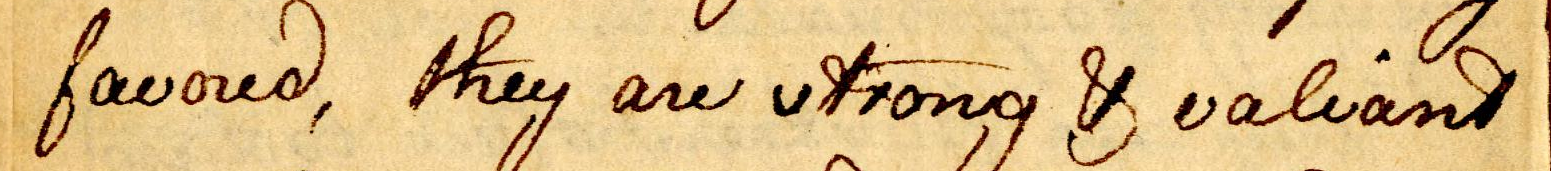favored, they are strong & valiant
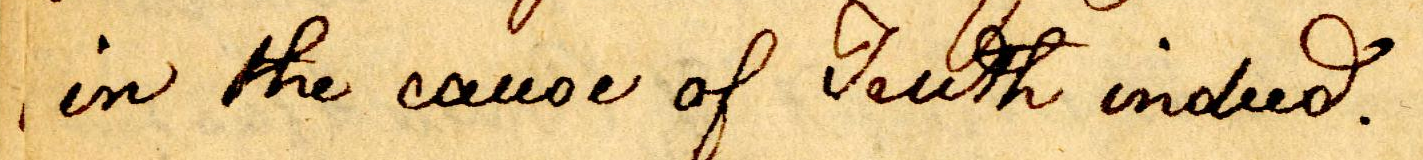in the cause of Truth indeed.
